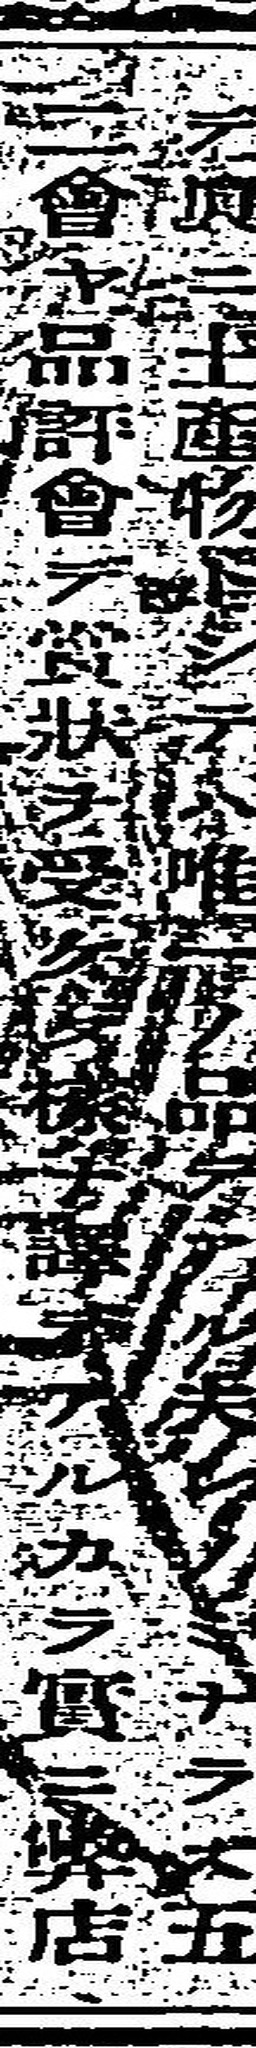二会ヤ品評会デ賞状ヲ受ケタ様ナ訳デアルカラ実ニ弊店
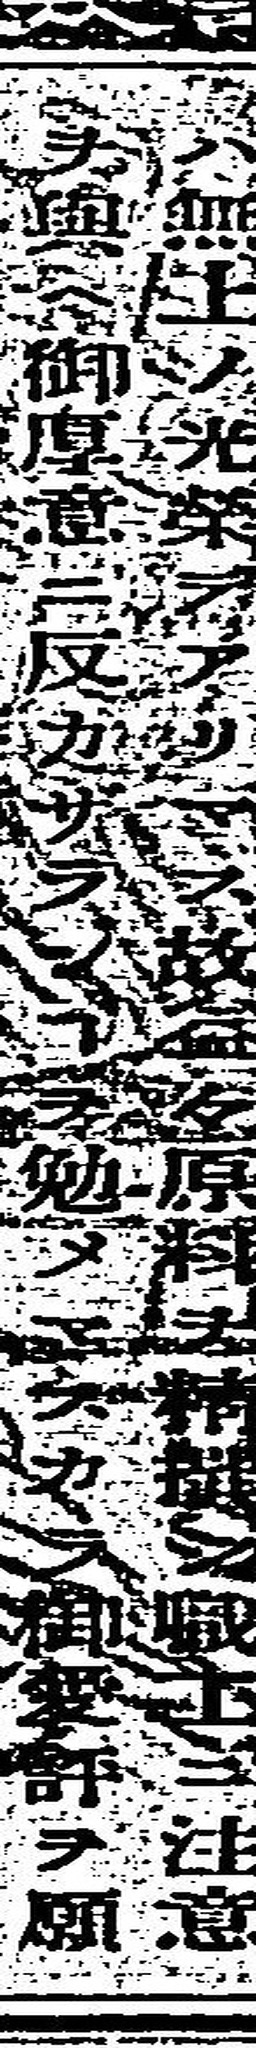ヲ与ヘ御厚意ニ反カザランヿヲ勉メマスカラ御愛評ヲ願
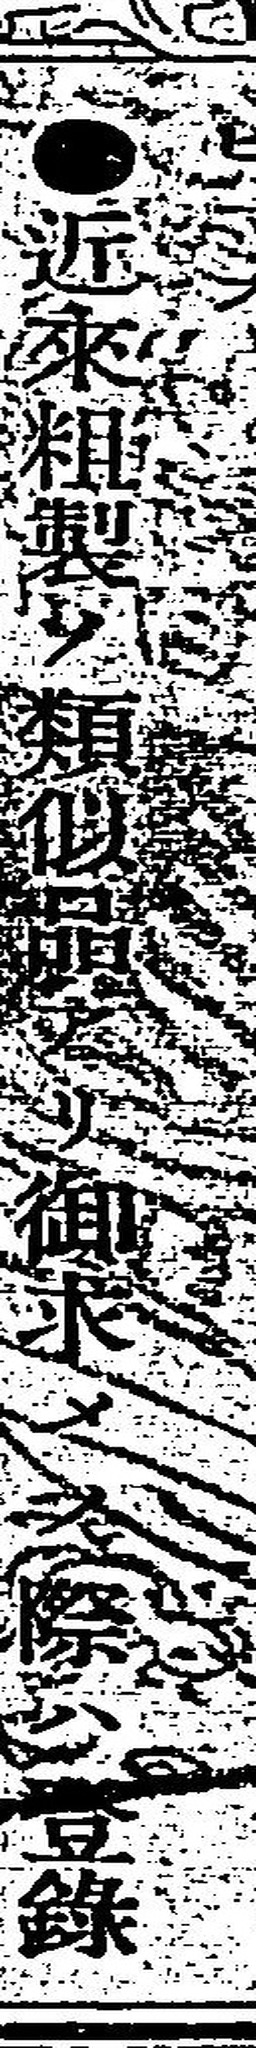●近来粗製ノ類似品アリ御求メノ際ハ登録
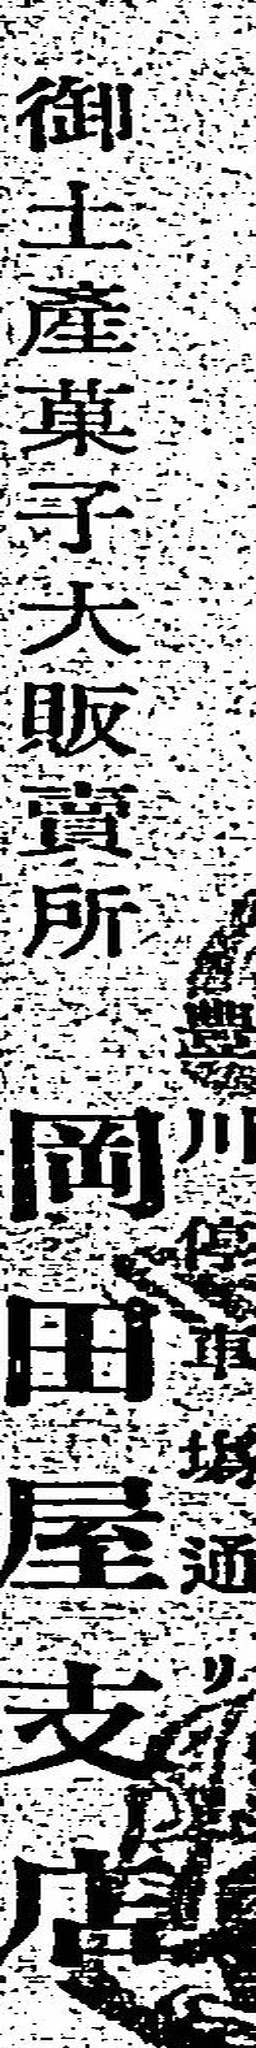御土産菓子大販売所岡田屋支店

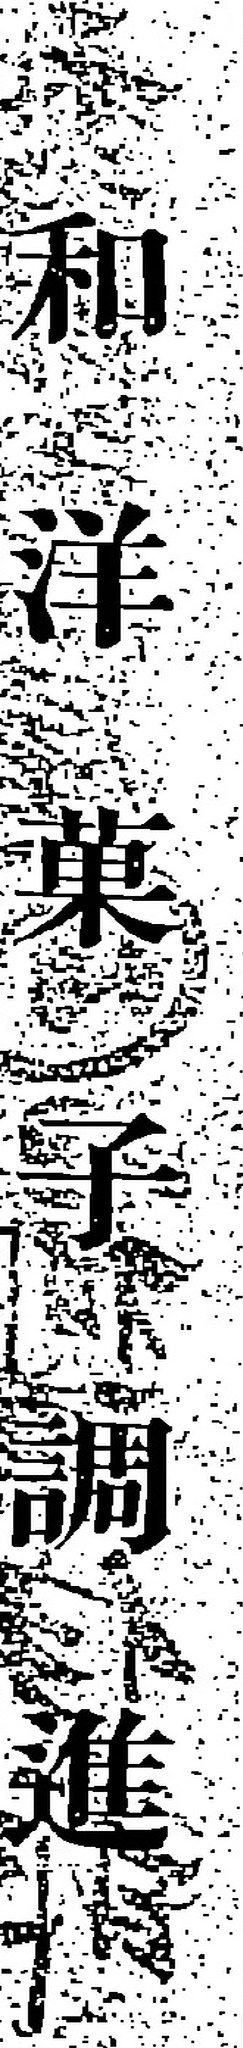和洋菓子調進
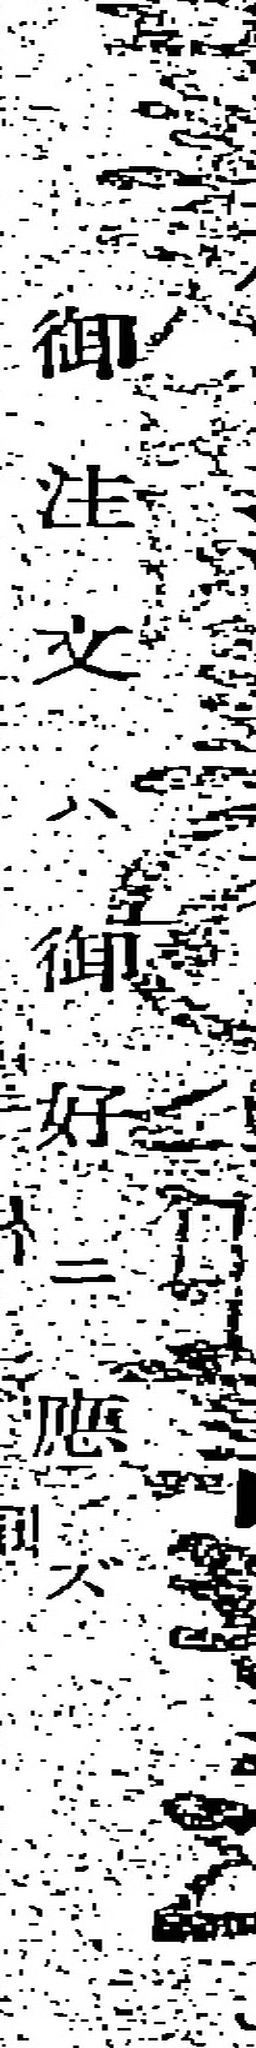御注文ハ御好ニ応ズ
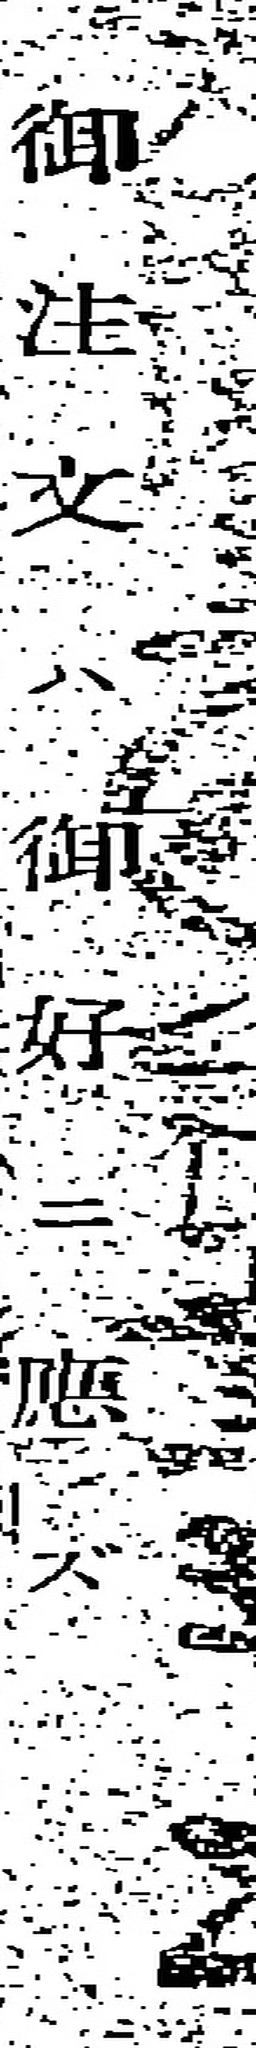御注文ハ御好ニ応ズ
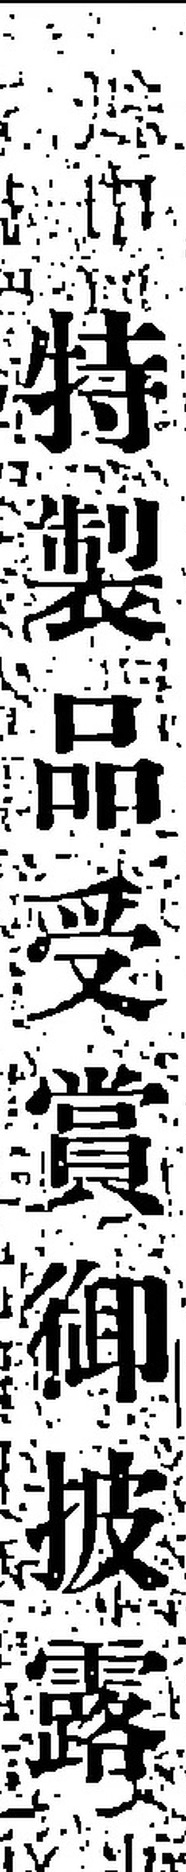特製品受賞御披露
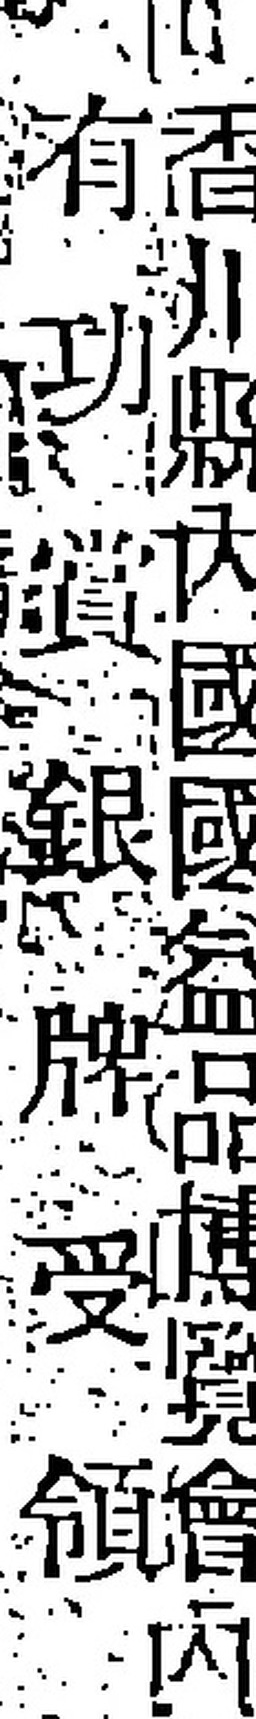有功賞銀牌受領
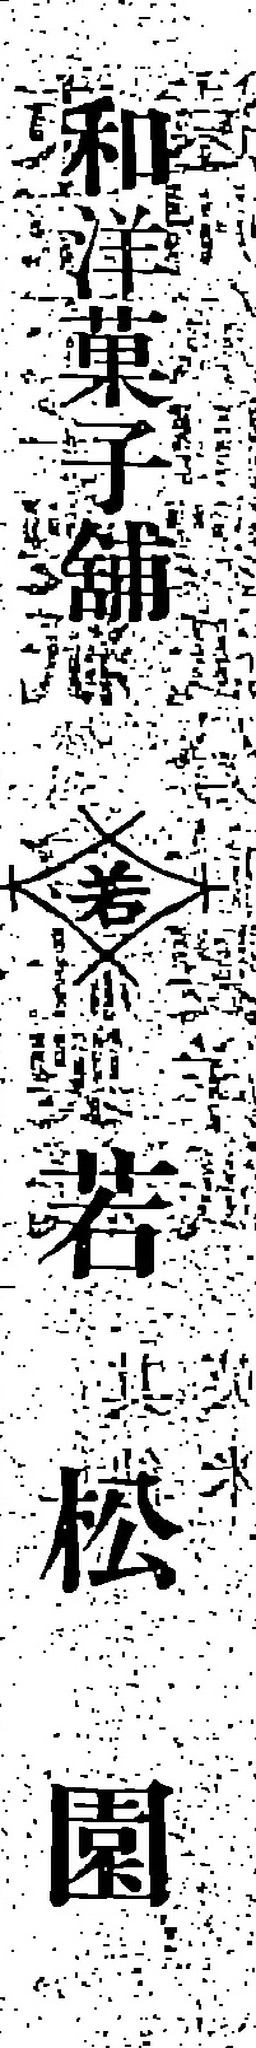和洋菓子舗若松園

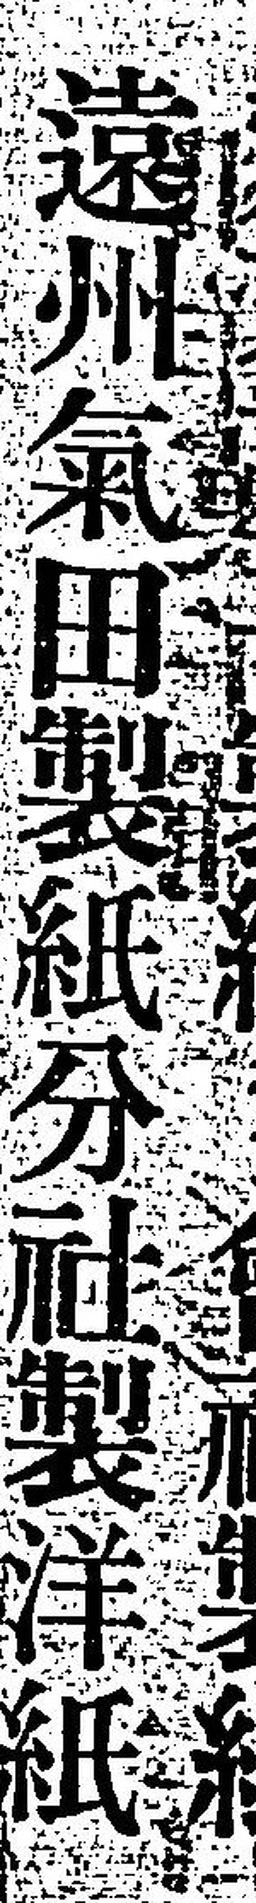遠州気田製紙分社製洋紙
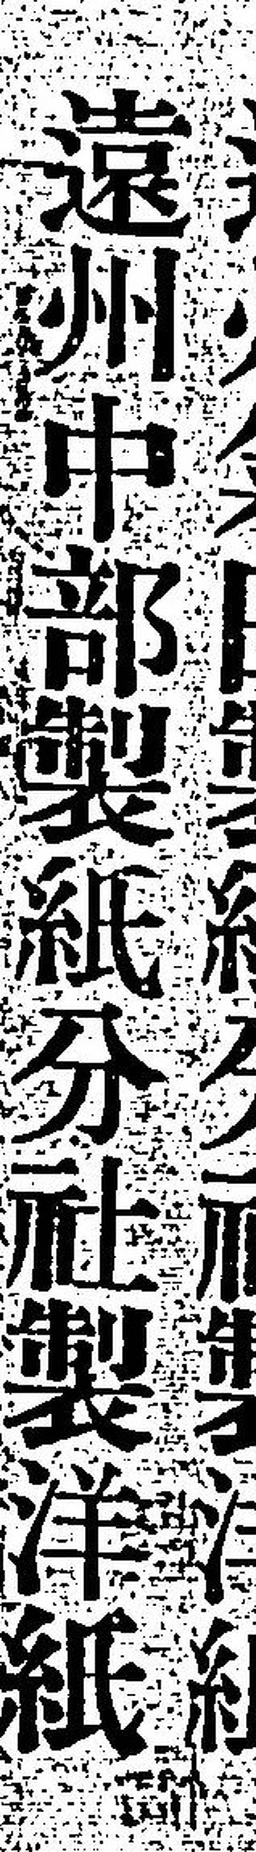遠州中部製紙分社製洋紙
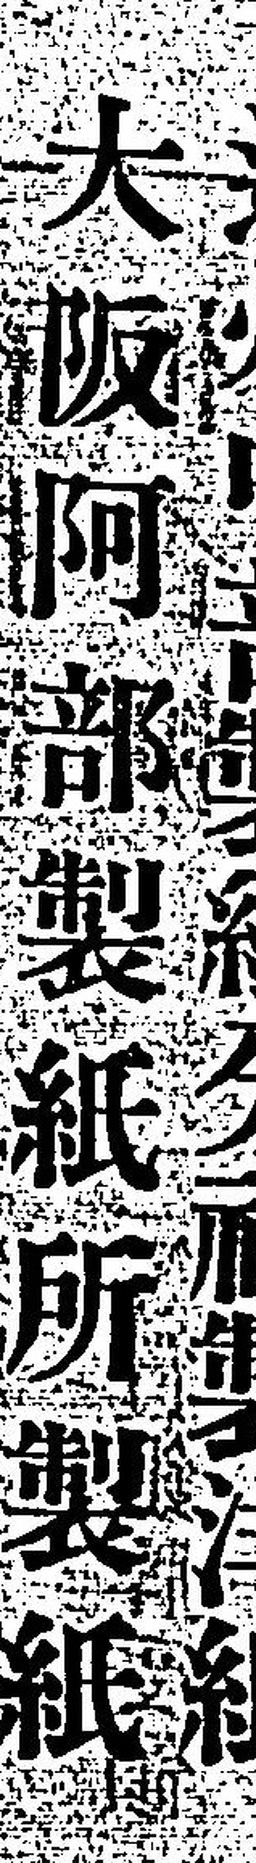大阪阿部製紙所製紙
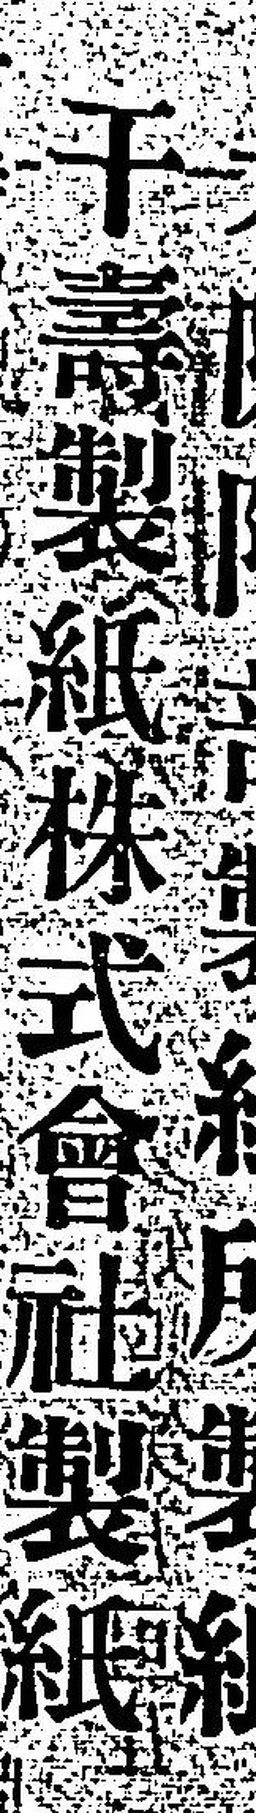千寿製紙株式会社製紙
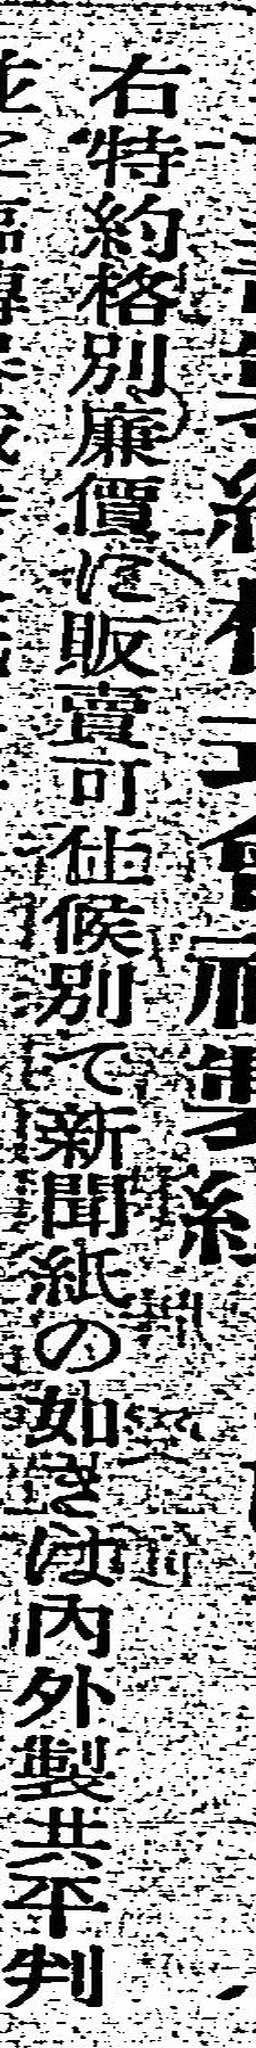右特約格別廉価に販売可仕候別て新聞紙の如きは内外製共平判
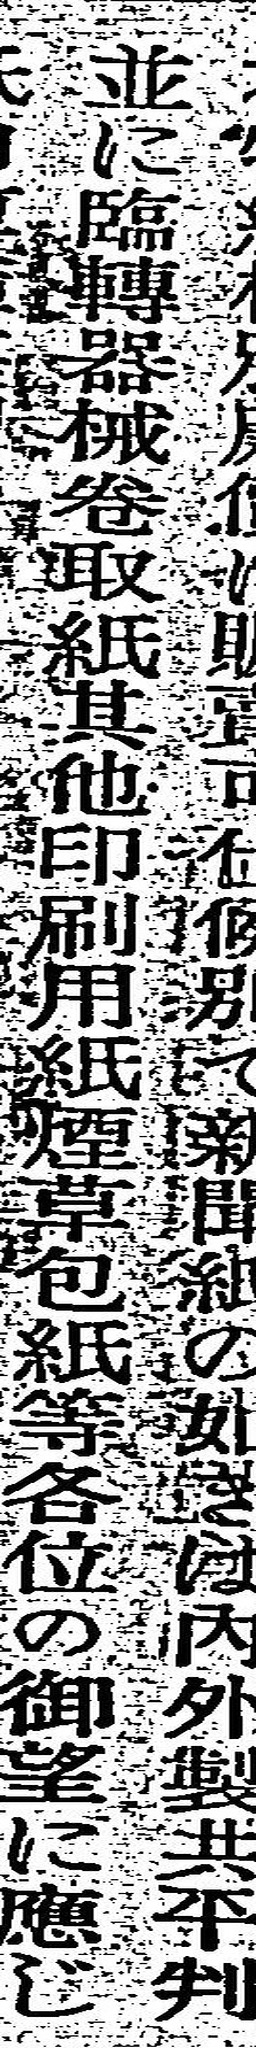並に臨転器械巻取紙其他印刷用紙煙草包紙等各位の御望に応じ
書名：東参名勝案内
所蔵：国立国会図書館 National Diet Library, JAPAN
